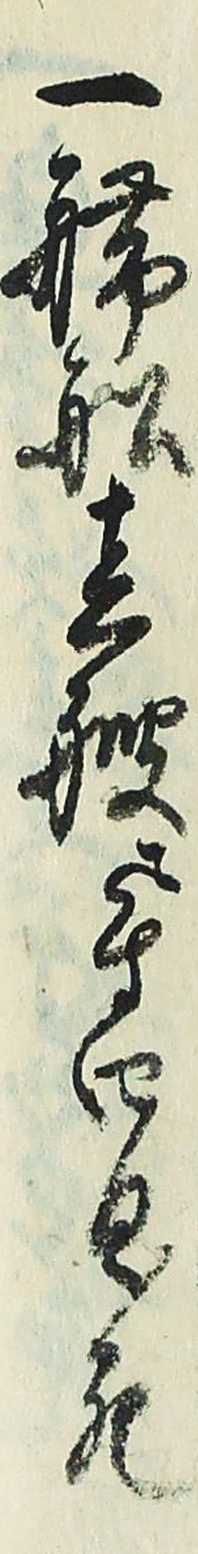一艜船一艘に付四匁宛
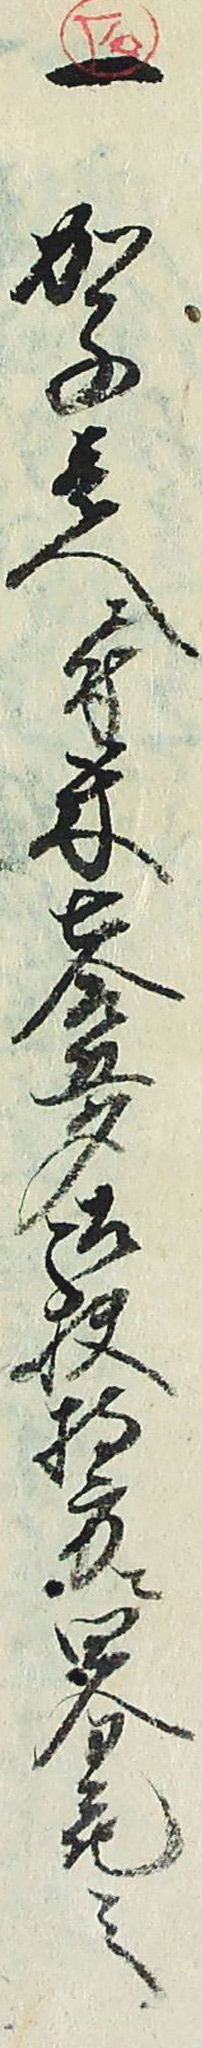一加子一人に付米七合五勺御扶持方に四分宛の
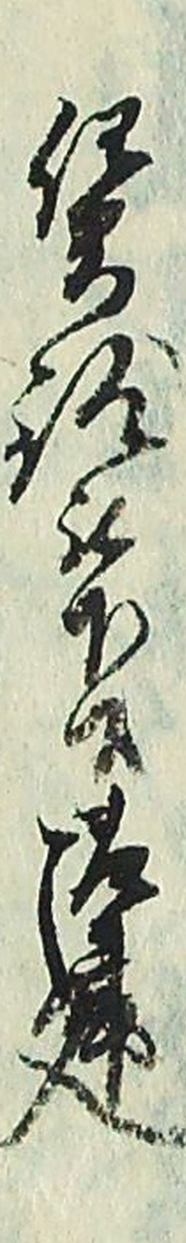賃銀被下候御建
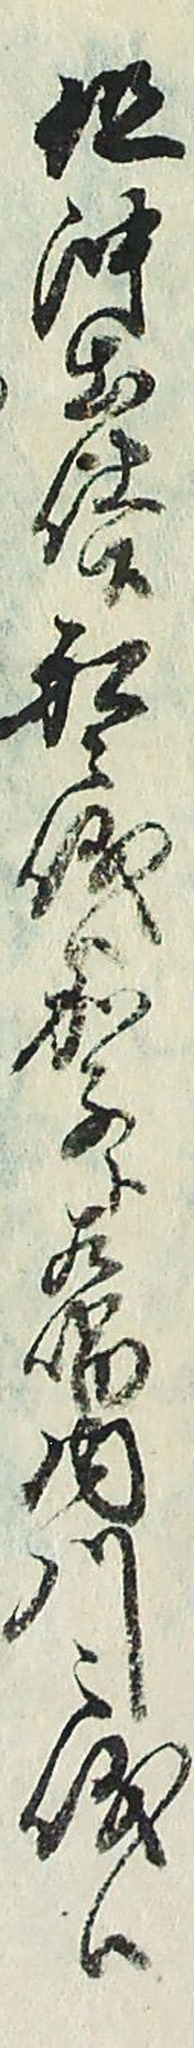但沖出仕候船の儀は加子と相唱内川の儀は
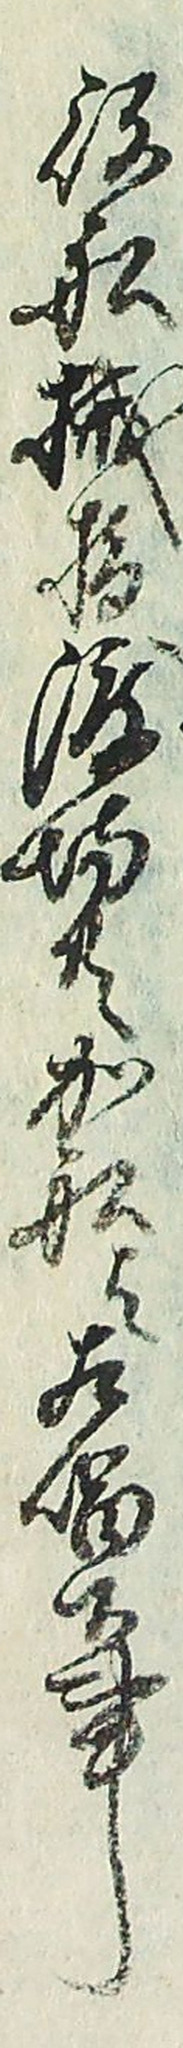役船械指渡場共加船と相唱候事
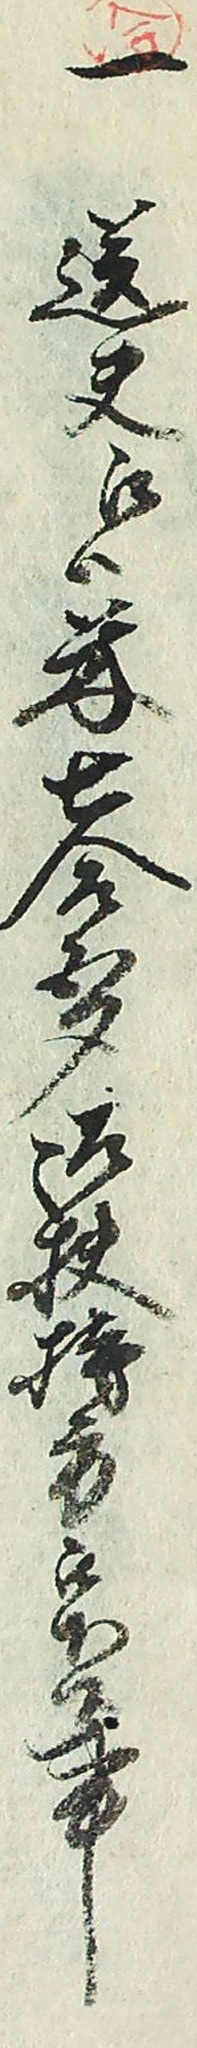一送夫えは米七合五勺御扶持方被下候事
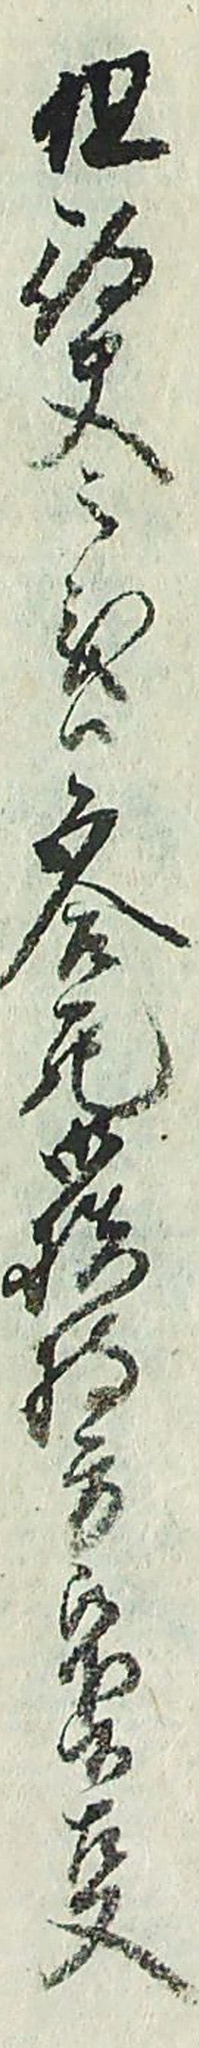但待夫の義は五合宛御扶持方被下候事
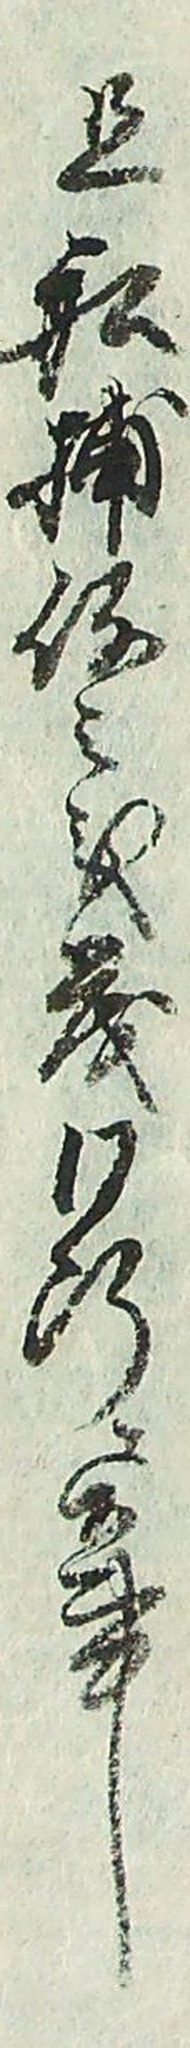但船捕役の義も同断に候事

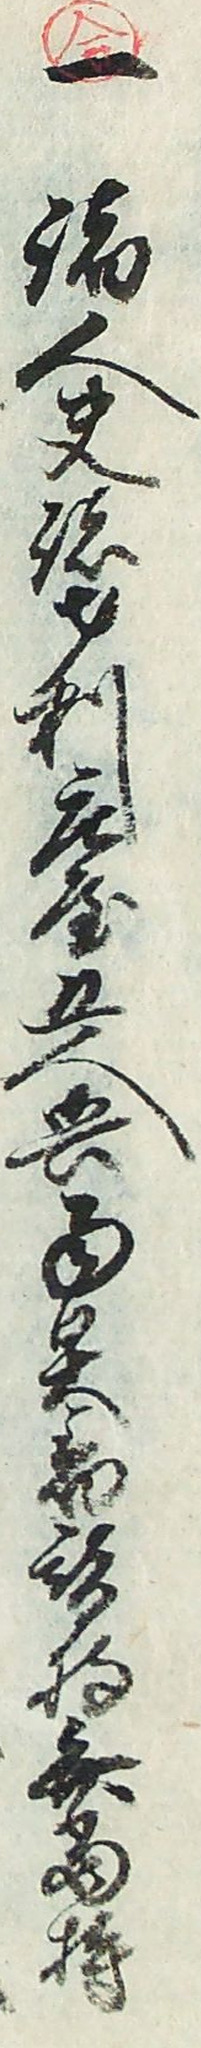一諸人夫諸才判庄屋五人与雨具着替持弁当持
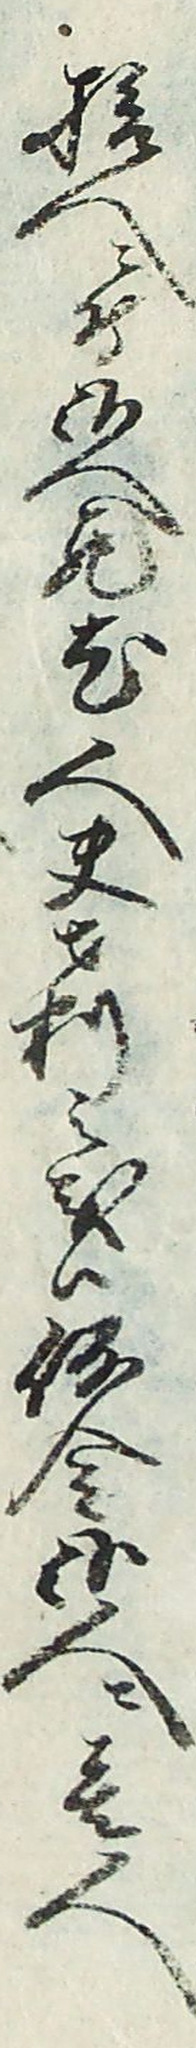十人に付二人宛尤人夫才判の義は仮令二人に付一人
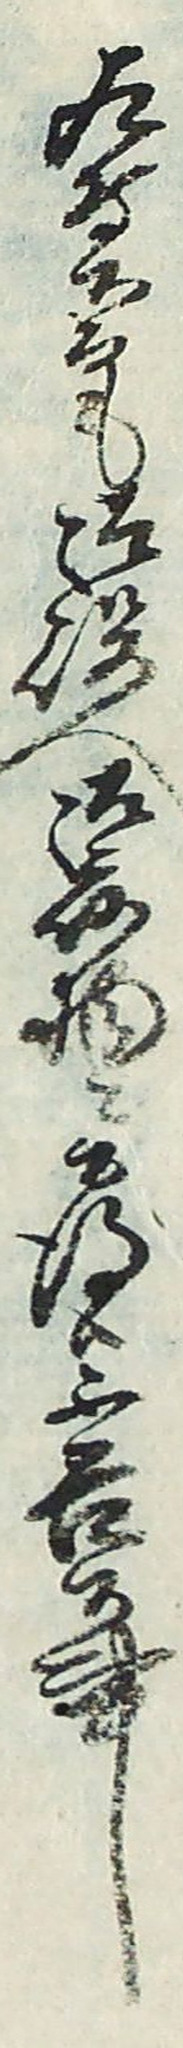相付候ても御役人御荷物に候得は不苦候事
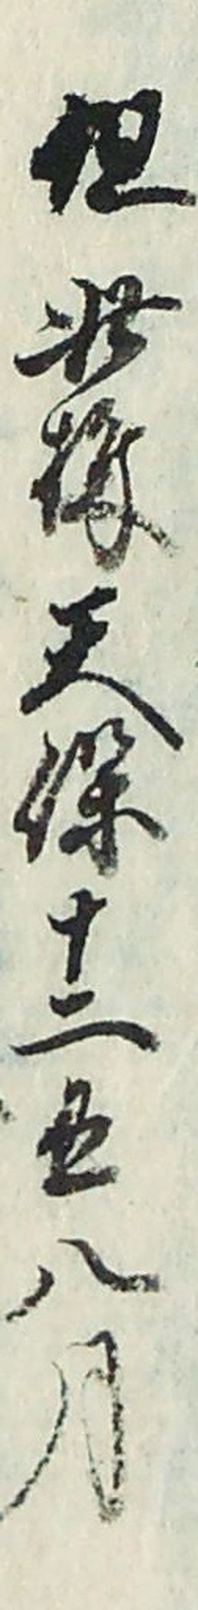但此株天保十二丑八月
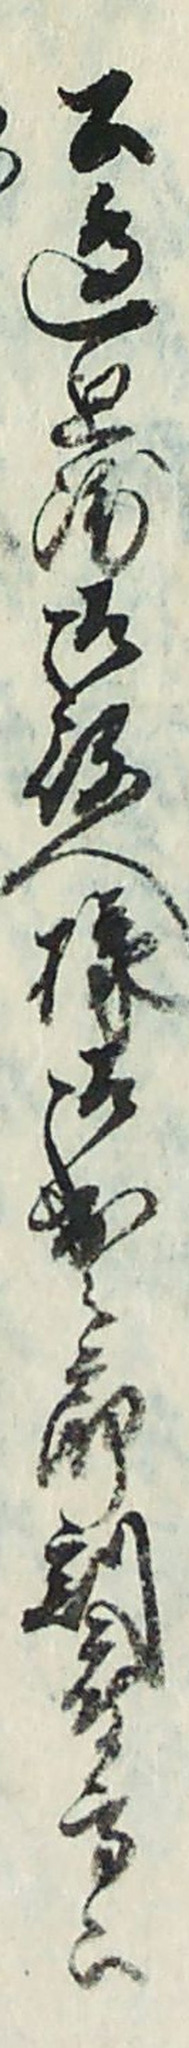公辺廻浦御役人様御出の節割符方被
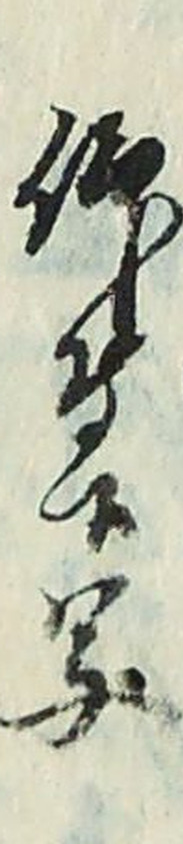仰付候写
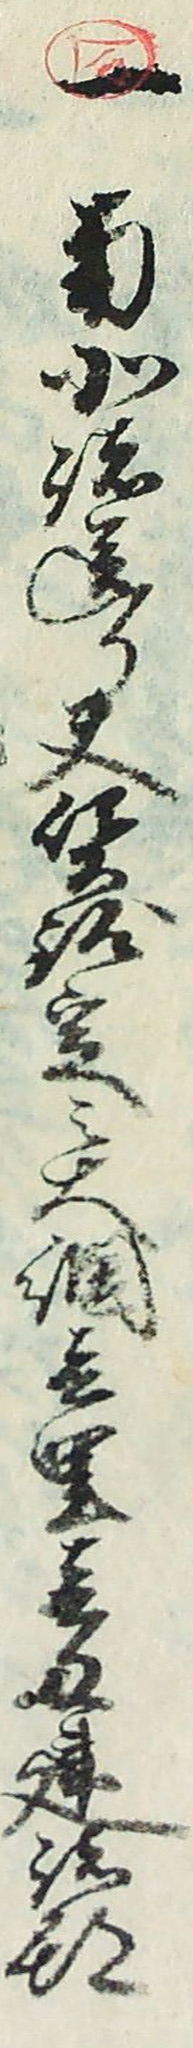一南北諸送り夫賃銀定の大綱一里一匁建諸郡
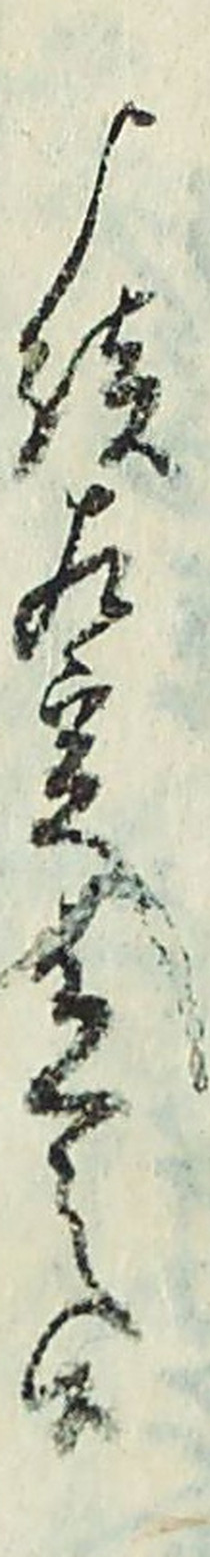申談相定有之候
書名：諸割賦物賃銀定記録帳
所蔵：鳴門教育大学 Naruto University of Education
